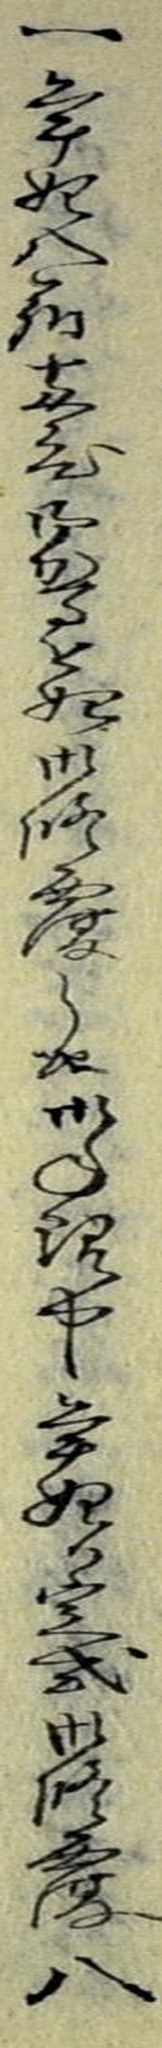一年始八朔両度御駕を始御修覆之儀御年限中年始は定式御修覆八
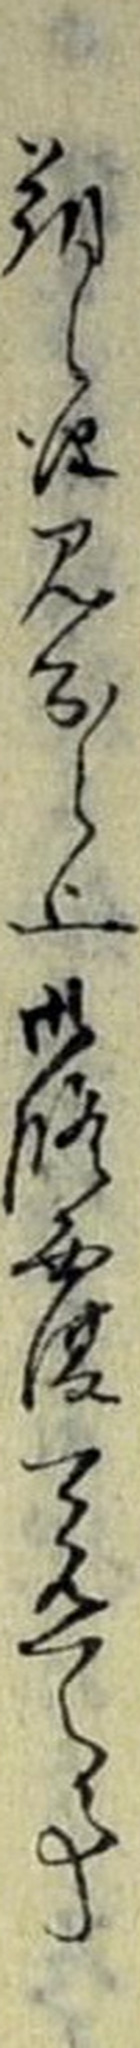朔之儀見分之上御修覆可有之事
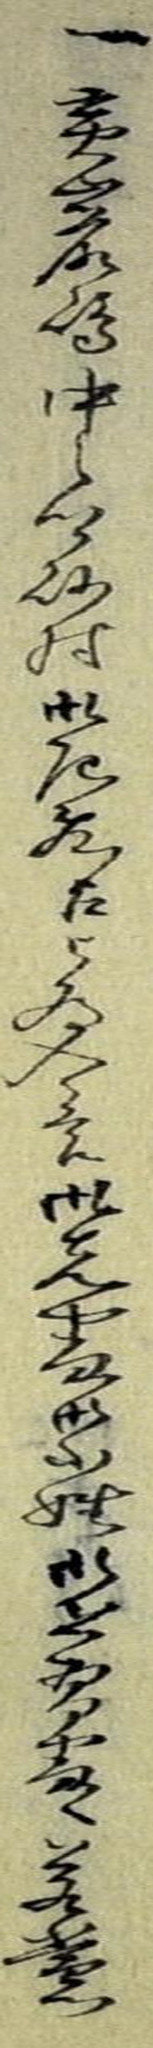一霊岸嶋中之郷砂村御屋敷江被為入候節御先番御小姓御近習番若党
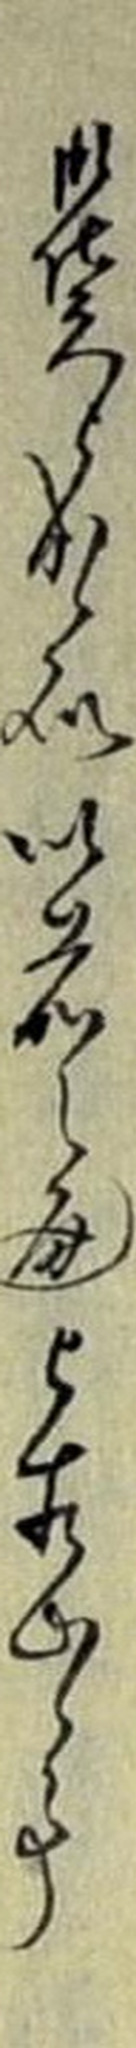御貸被成候処以前之通被相止候事
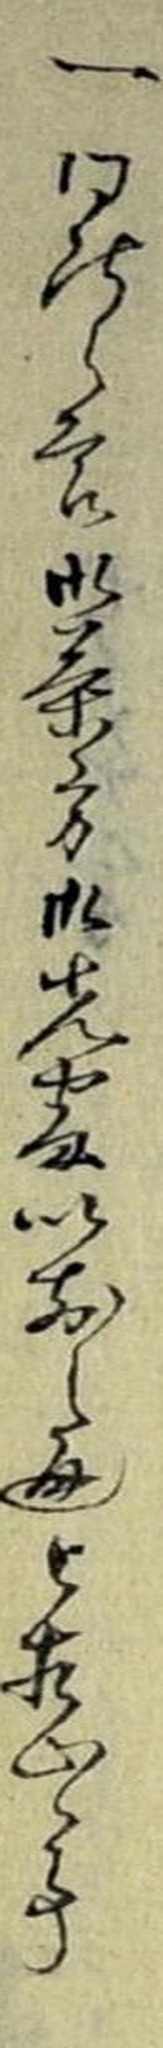一同断之節御茶方御先番以前之通被相止候事
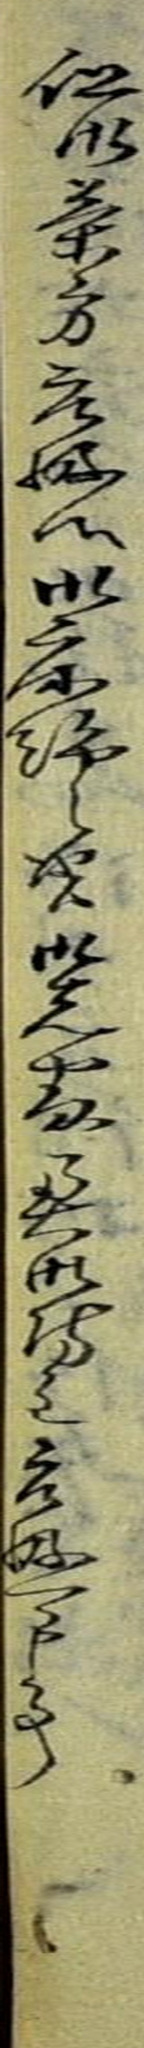但御茶方取扱候御床飾之儀は御先番奥御坊主取扱可申事
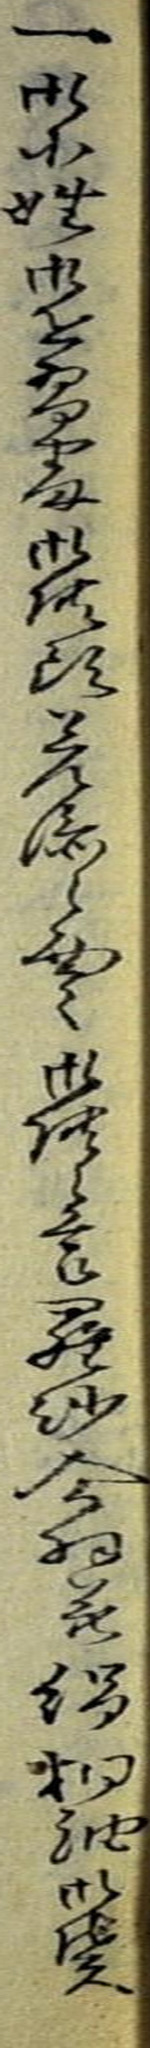一御小姓御近習番御供頭差添之面々御供之節羅紗合羽并絹桐油御貸
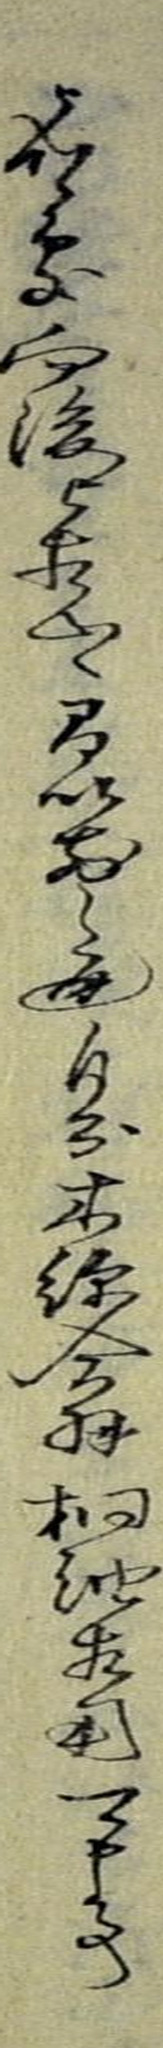被成候処向後被相止候間以前之通自分木綿合羽桐油相用可申事
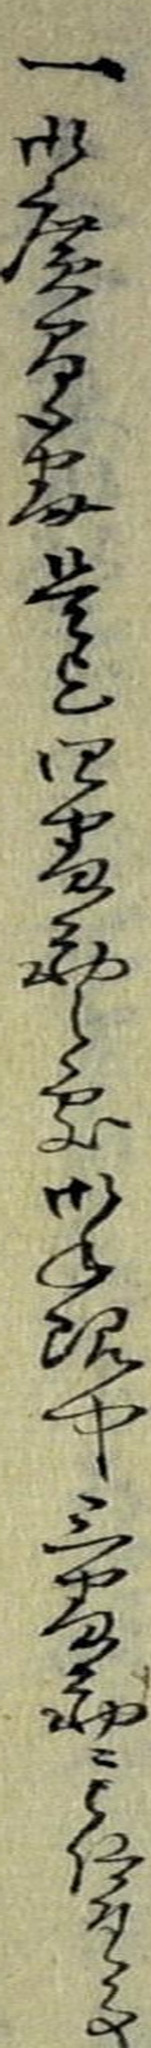一御広間番是迄四番勤之処御年限中三番勤に被仰付候事
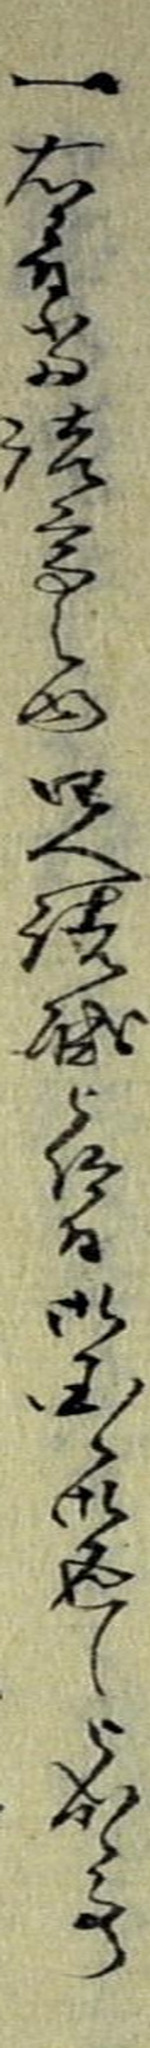一右に付当詰高之内四人詰減被仰付御国へ御返し被成候事
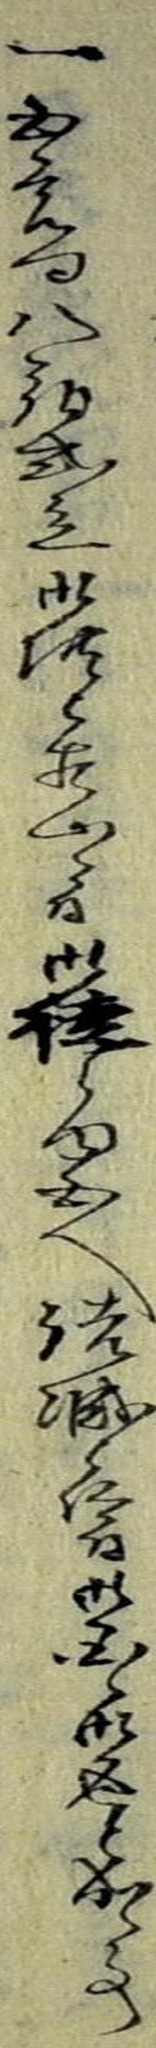一五節句八朔式立御供被相止候に付御詰之内五人詰減被仰付御国へ御返し被成候事
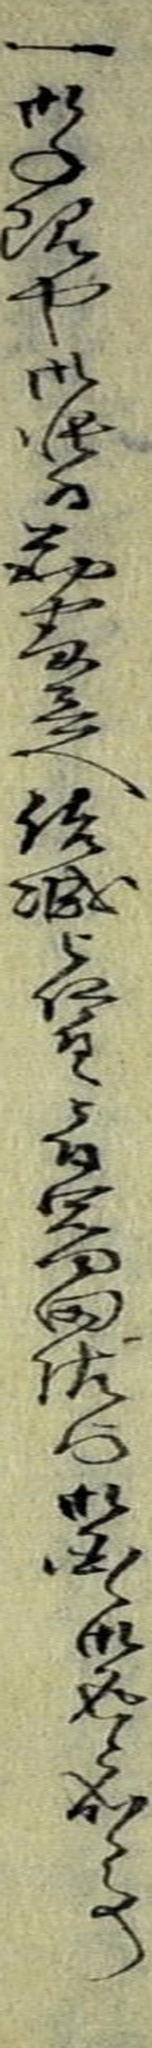一御年限中御帳付勤番壱人詰減被仰付候に付冨田佐右衛門御国へ御返被成候事
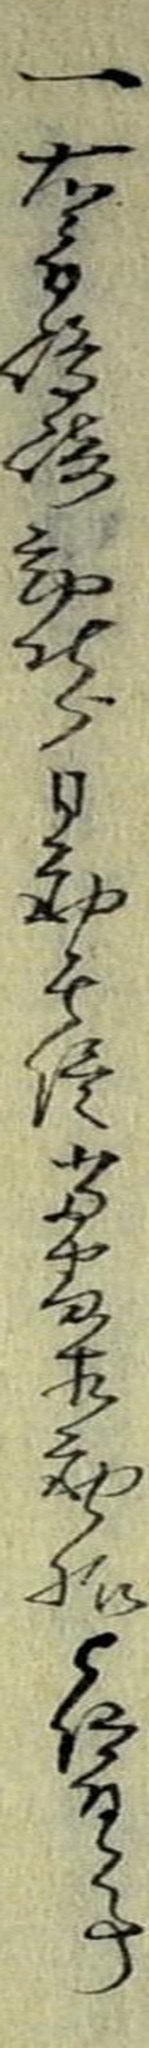一右に付嶋崎勘次郎日勤其侭当番相勤候様被仰付候事
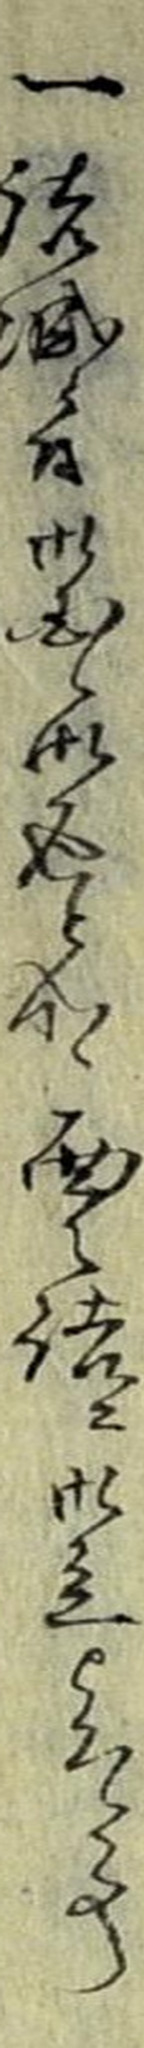一詰減に付御国へ御返被成候面々詰に御立被下候事
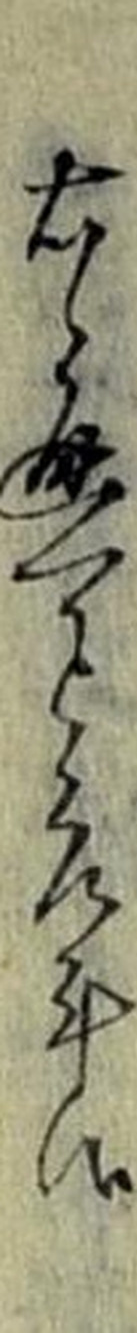右之通可被取斗候
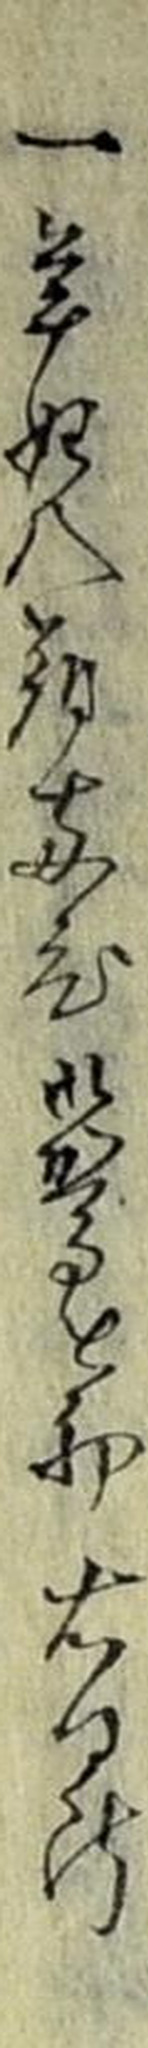一年始八朔両度御駕を初右同断
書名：命令之部 六
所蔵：福井県文書館 Fukui Prefectural Archives
